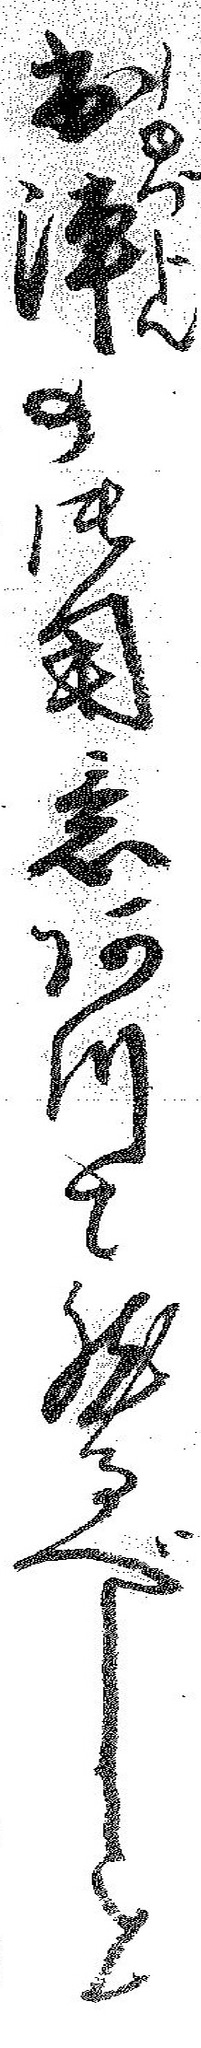出陣の御用意あつて然るべしと
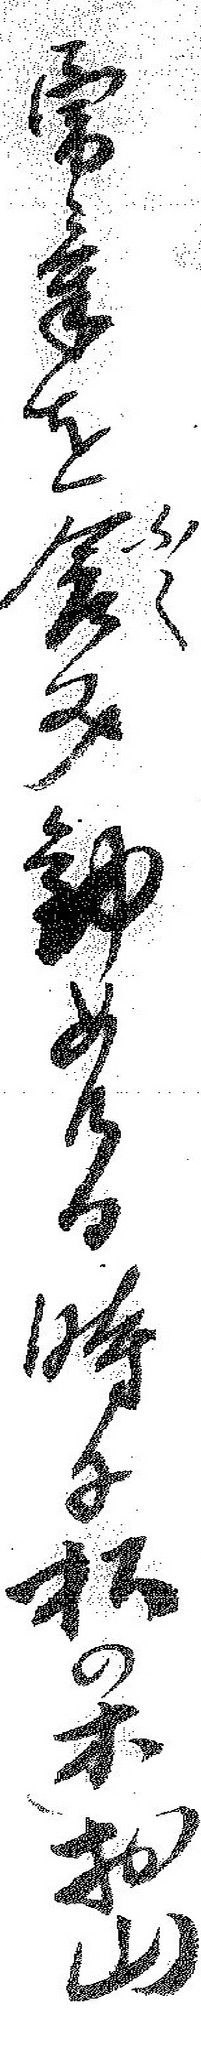勇気を含み勧めける時に松の木お山
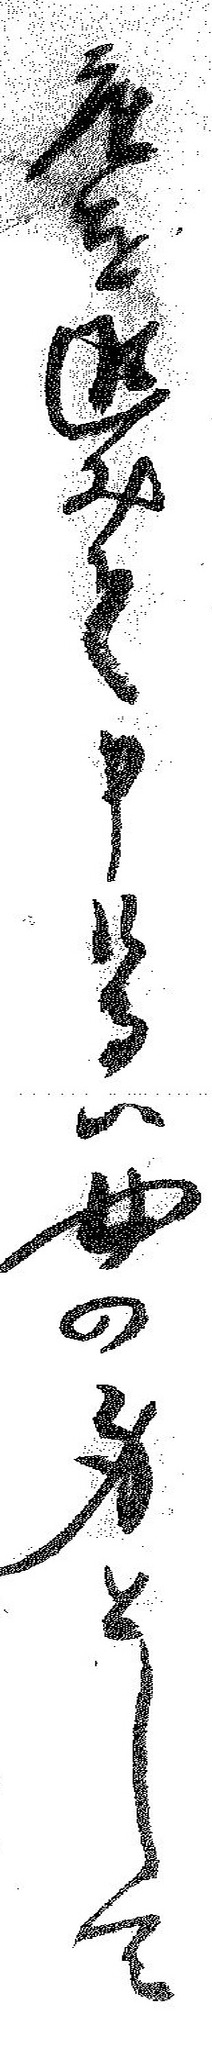座を進みて申けるは女の身として
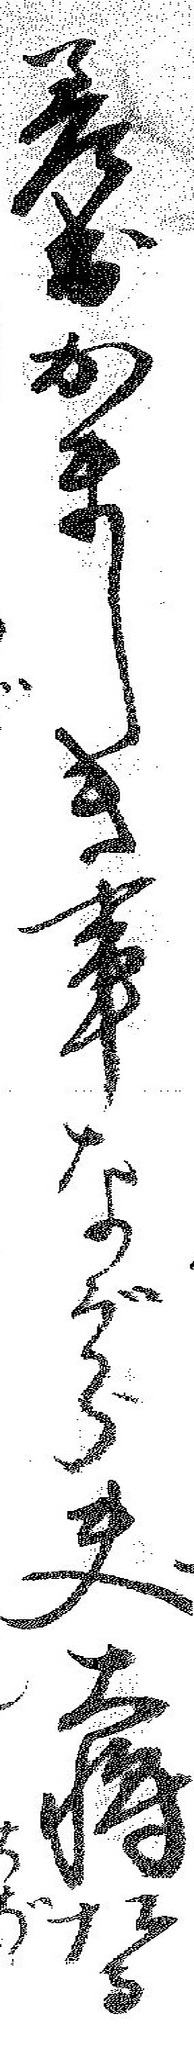差出かましき事ながら夫大将たる
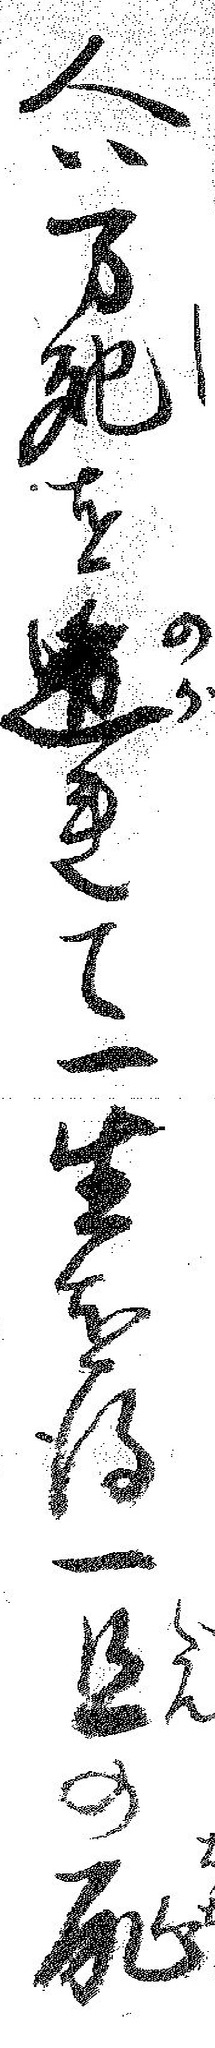人は万死を遁れて一生を得一旦の恥
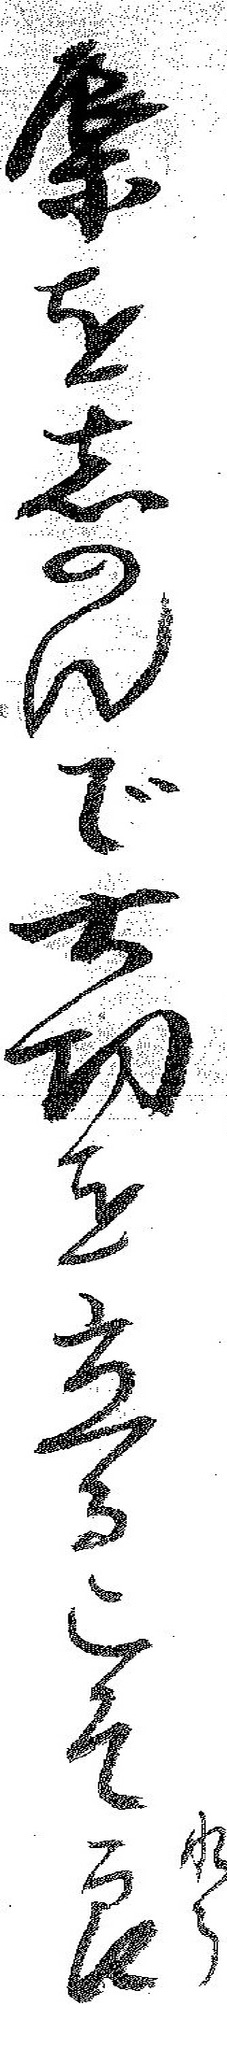辱をしのんで大功を立るこそ良
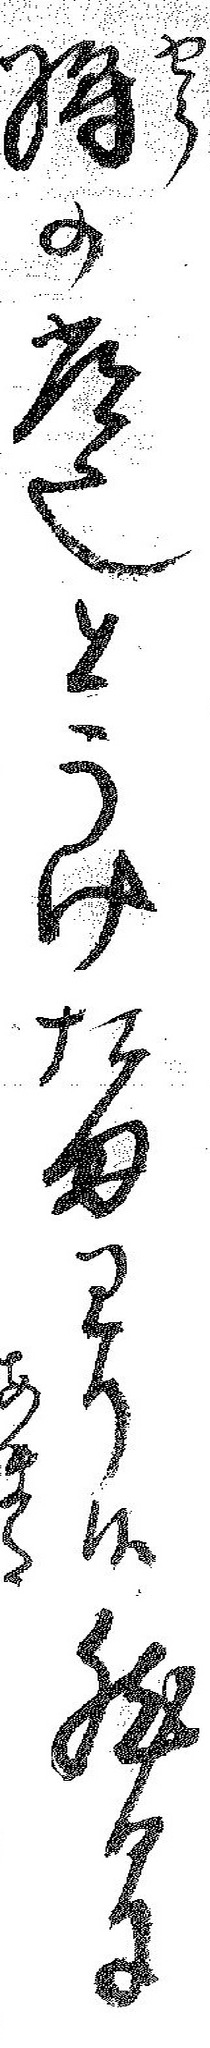将の常也とうけたまわり候然るに
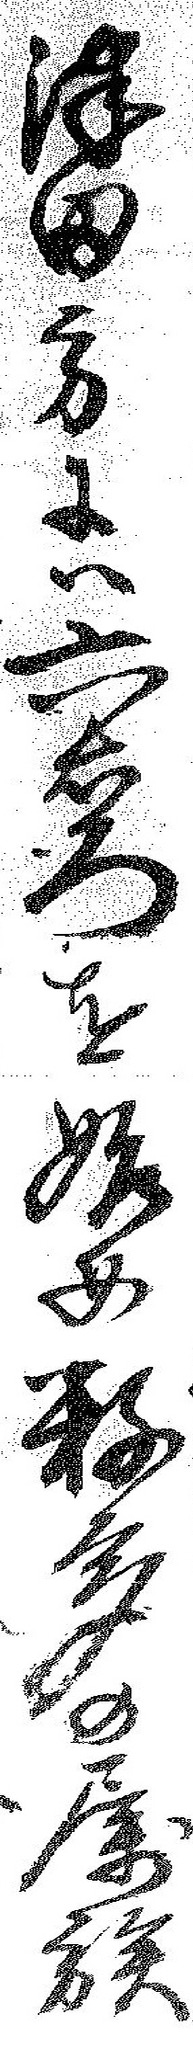津田方には六右衛門を始め数多の属族
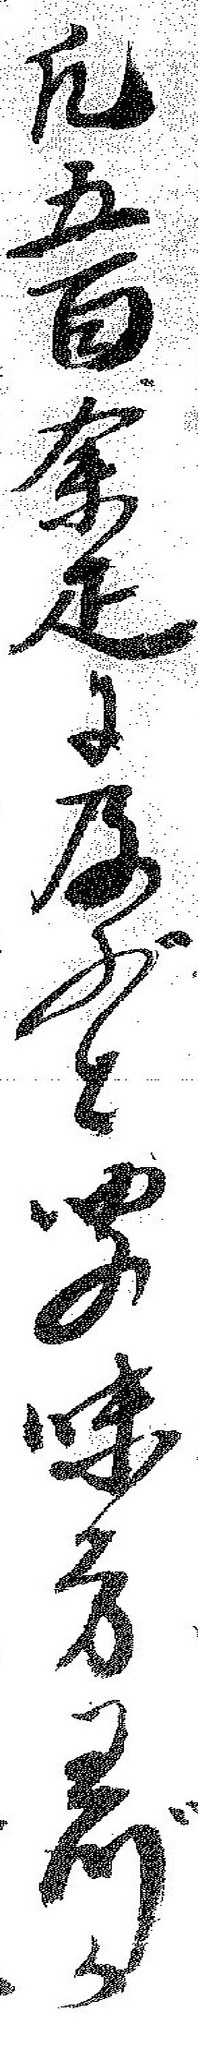凡五百余疋に及ぶと聞味方わづか
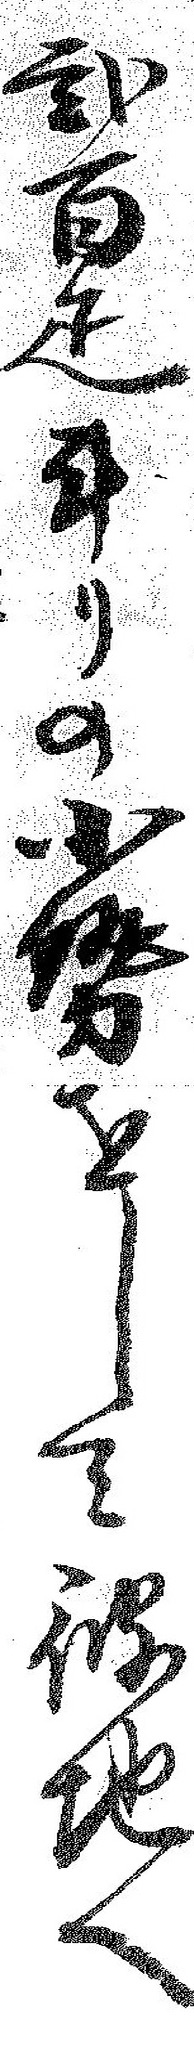弐百疋計りの小勢をして彼地へ
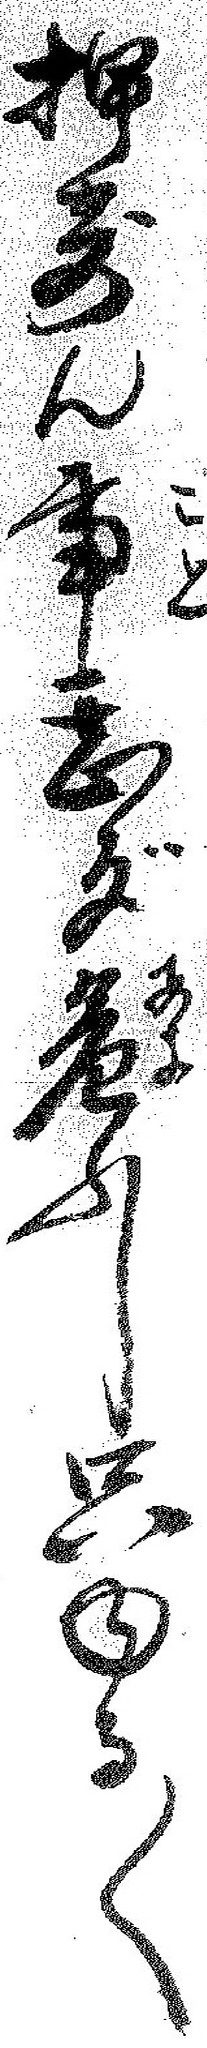押寄ん事甚だ危ふし只ゆる〳〵
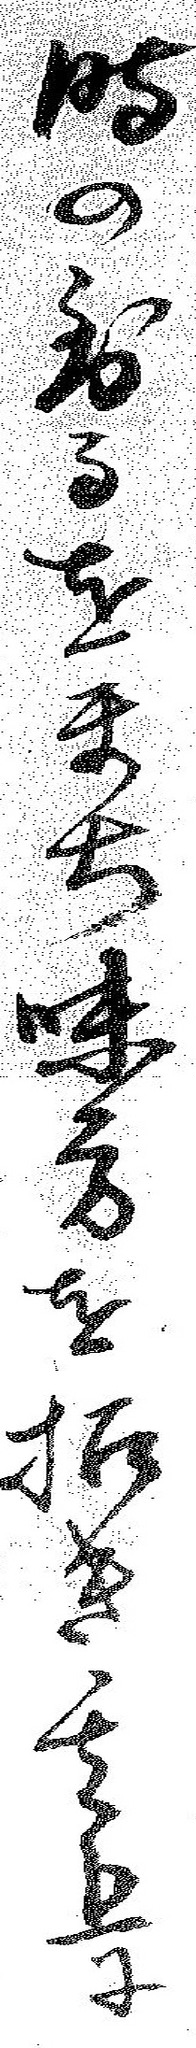時の至るをまち味方を招き其上に
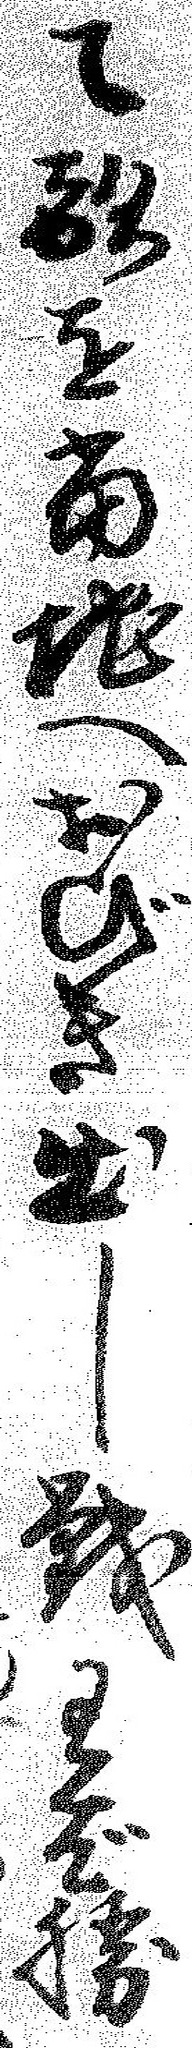て敵を当地へおびき出し戦わば勝
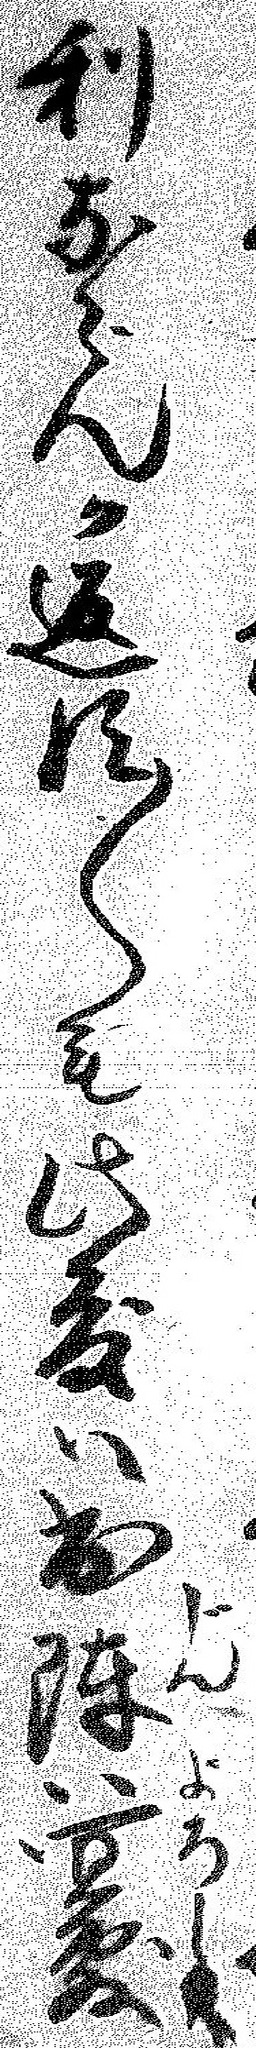利ならんか返す〳〵も此度は出陣は宜敷

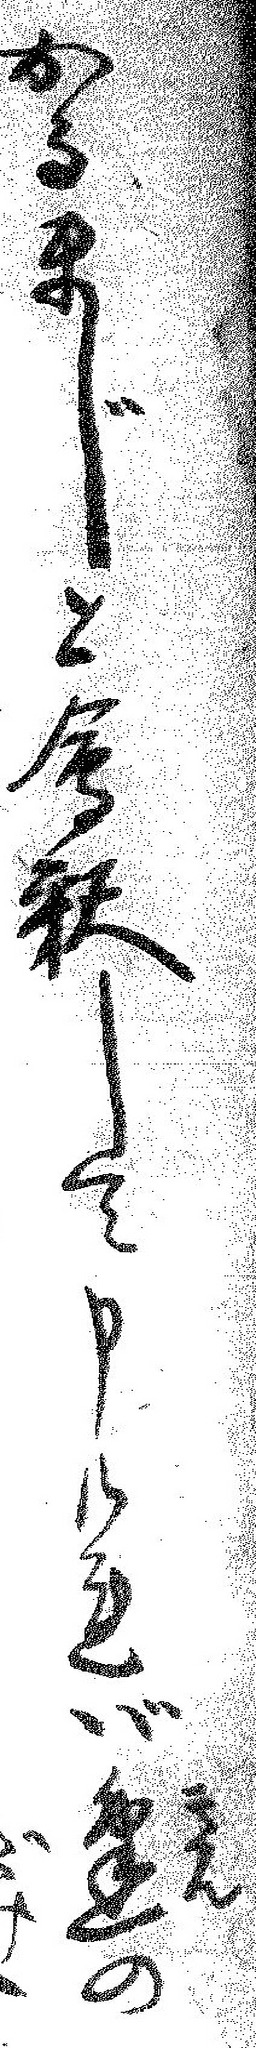かるまじと会釈して申ければ金の
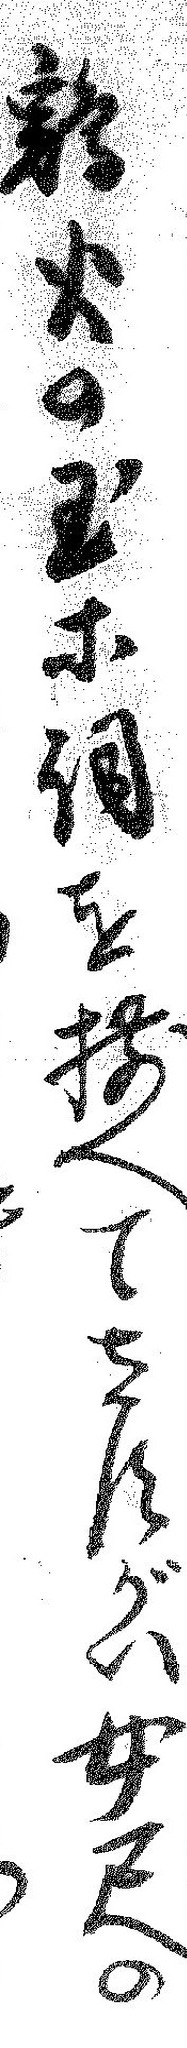鶏火の玉等詞を揃へてさすがは女尺の
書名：近頃古狸珍説　礼義智信
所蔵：徳島県立図書館
